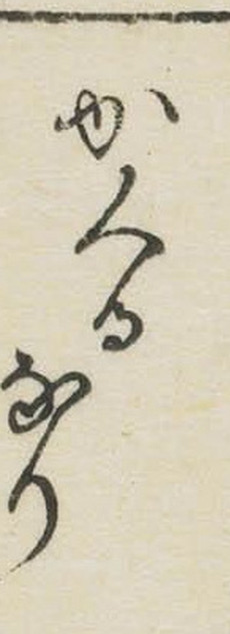かくるなり
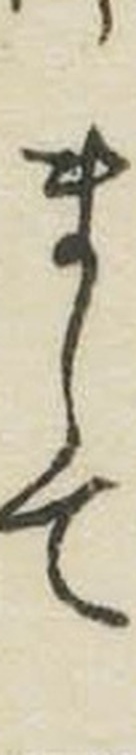まして
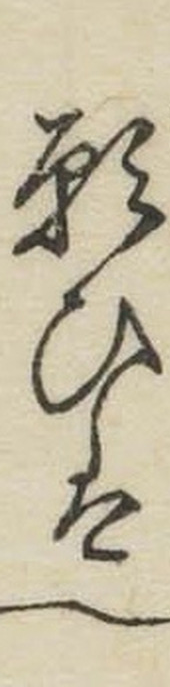願ひは

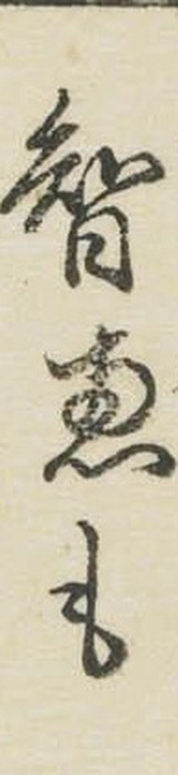智恵も
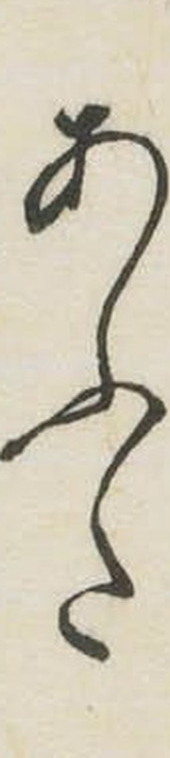あふた

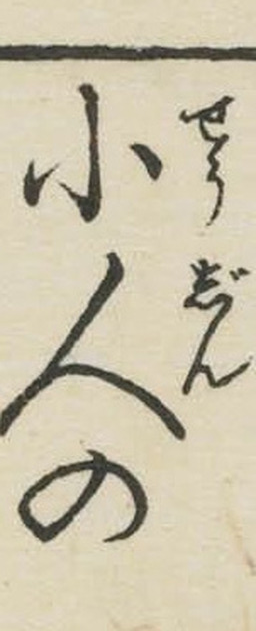小人の
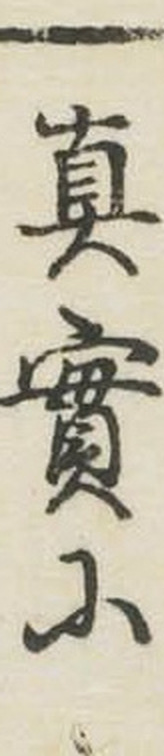真実に
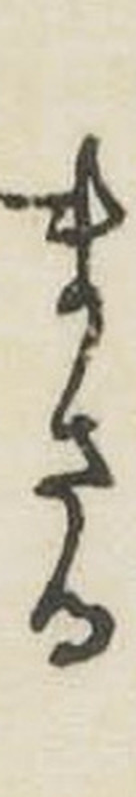まさる
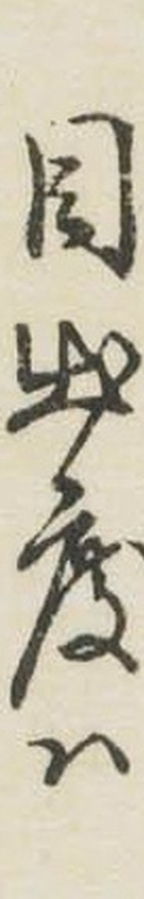目出度は
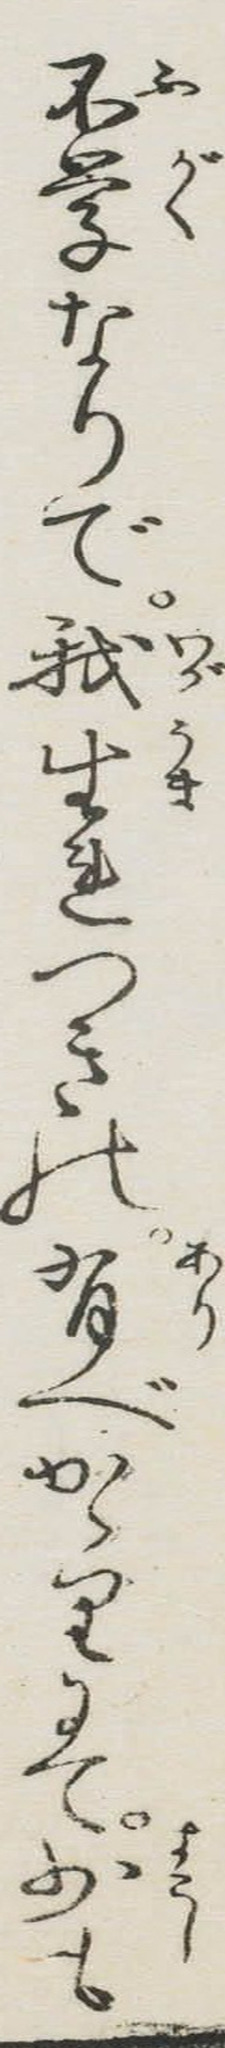不学なりで。我生れつきの。有べかゝりにて。少も
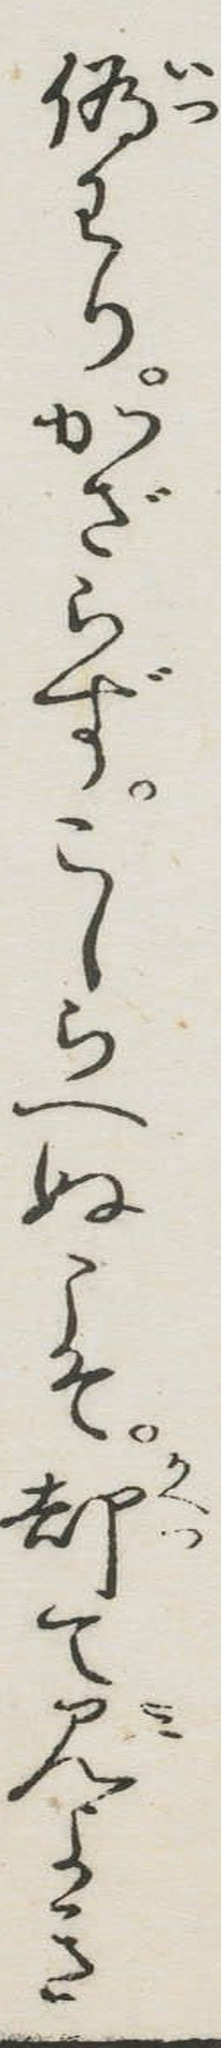偽わり。かざらず。こしらへぬこそ。却て見よき
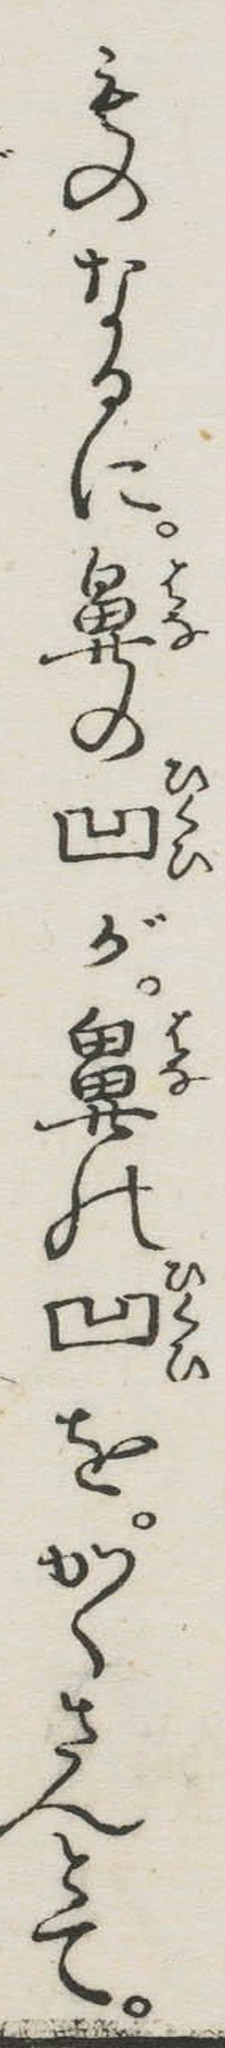ものなるに。鼻の凹が。鼻の凹を。かくさんとて。
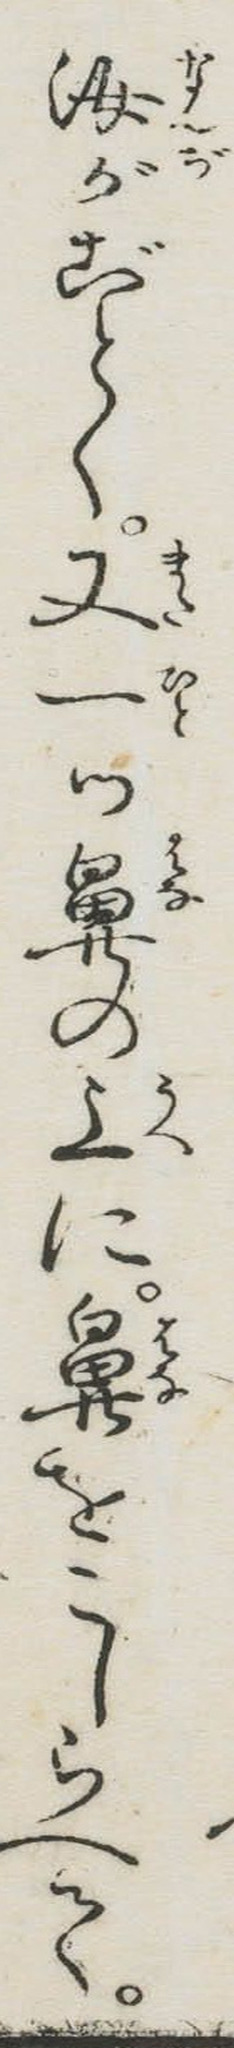汝がごとく。又一つ鼻の上に。鼻をこしらへて。
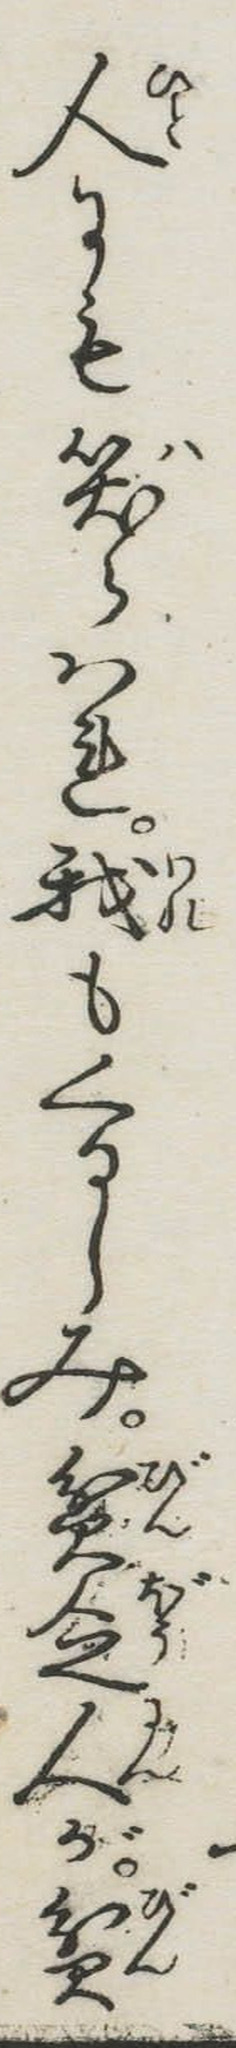人にも笑らはれ。我もくるしみ。貧乏人が。貧
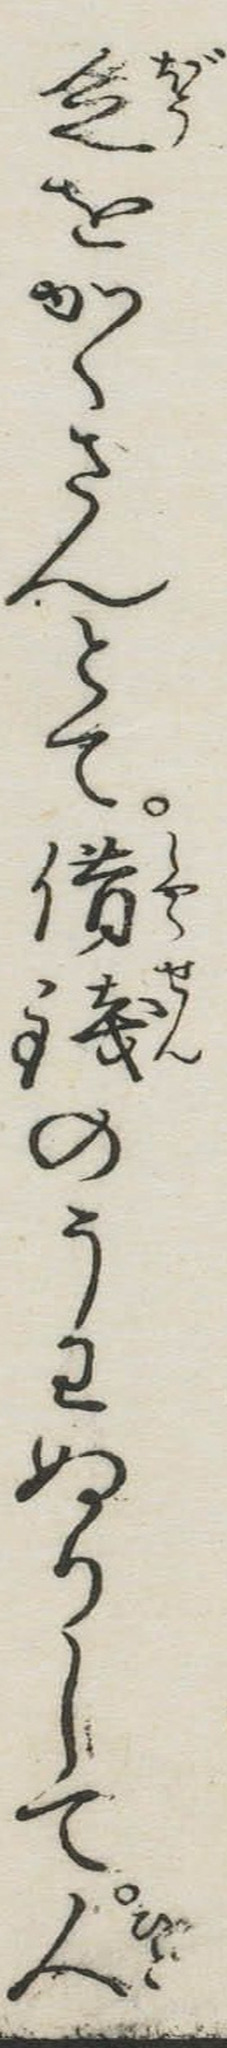乏をかくさんとて。借銭のうわぬりして。人
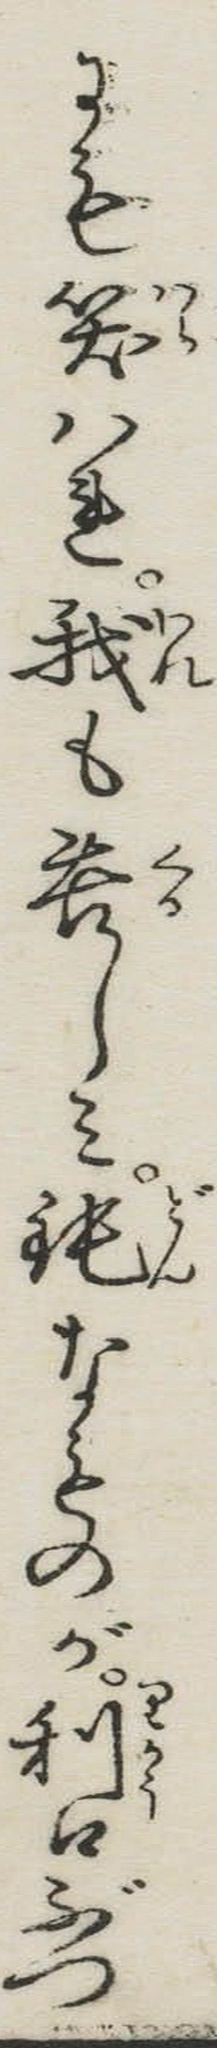にも笑はれ。我も苦しみ。鈍なものが。利口ぶつ
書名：福神おしへの小槌 2巻 上
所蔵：東京学芸大学教育コンテンツアーカイブ
